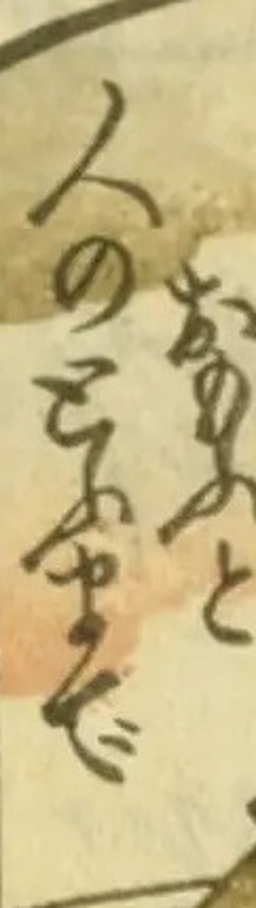人のとふまで
